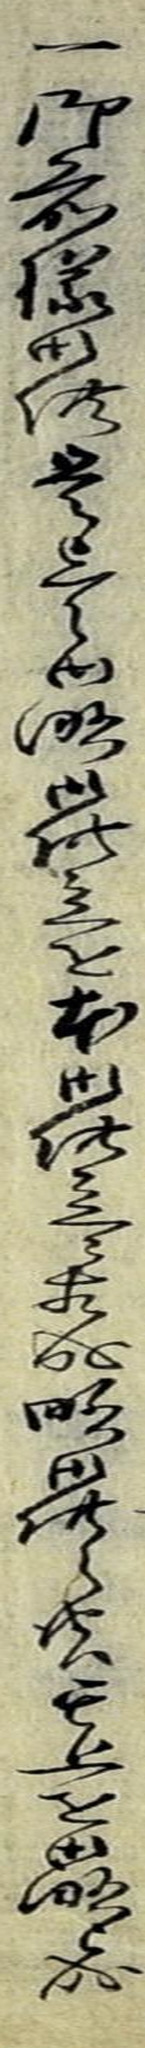一御前様御供是迄之御略御供立を本御供立に相成略御供之儀は其上を御略被成
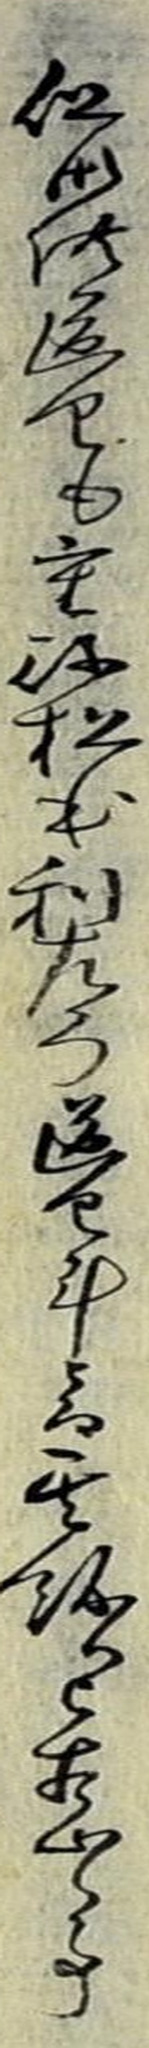但御供道具も重役松本利左衛門道具斗に而其余は被相止候事
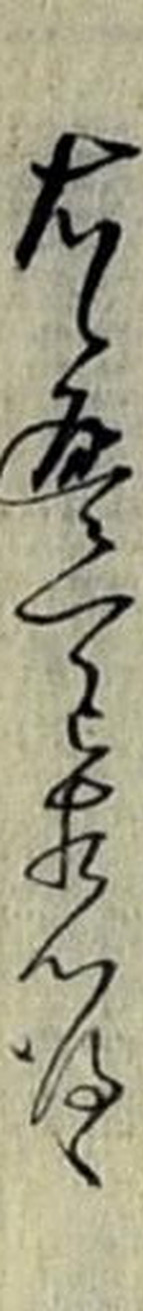右之通に可被相心得候
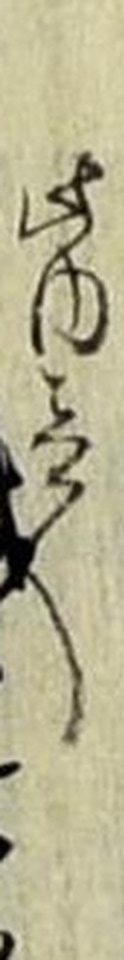此内壱人
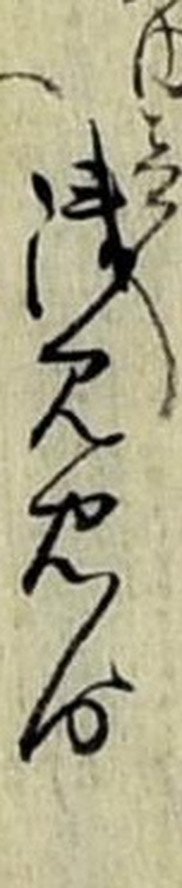浅見忠右衛門
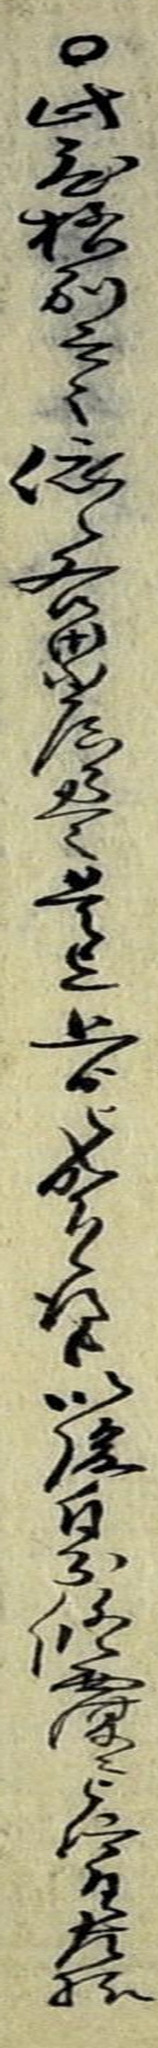〇此度格別云々依之各御小屋畳是迄上ゟ被成下候得共以後自分修覆に被仰付候左様
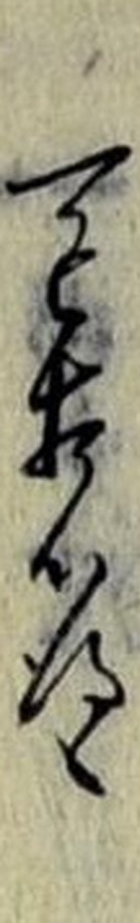可被相心得候
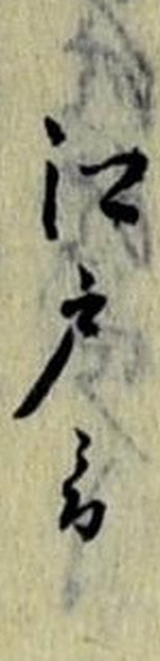江戸に而
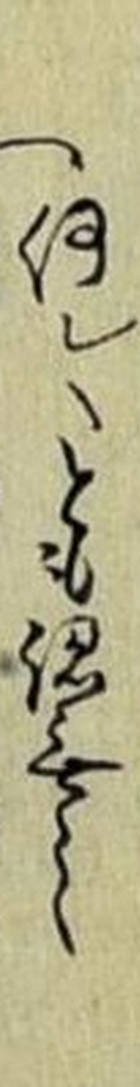何れへとも認無之
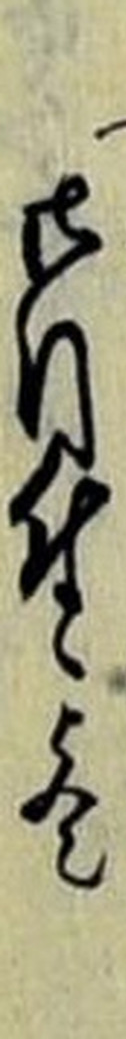御目付へ歟
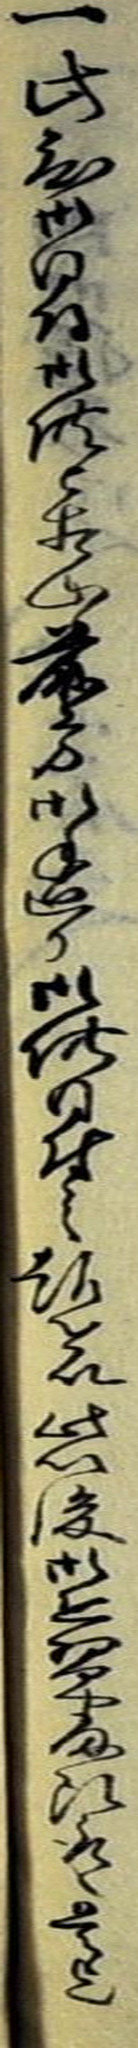一此度御目付御供被相止前方御手廻り御供目付之趣を以此以後御近習番頭取へ是迄
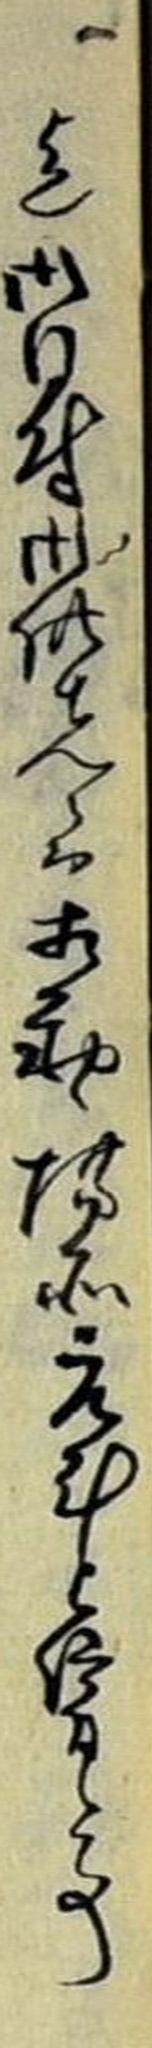迄御目付御供先に而相勤場所元斗被仰付候事
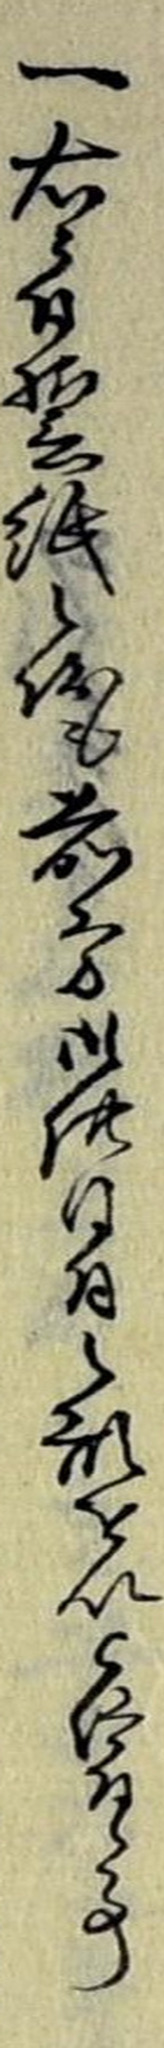一右に付誓紙之儀も前方御供目付之形を以被仰付候事
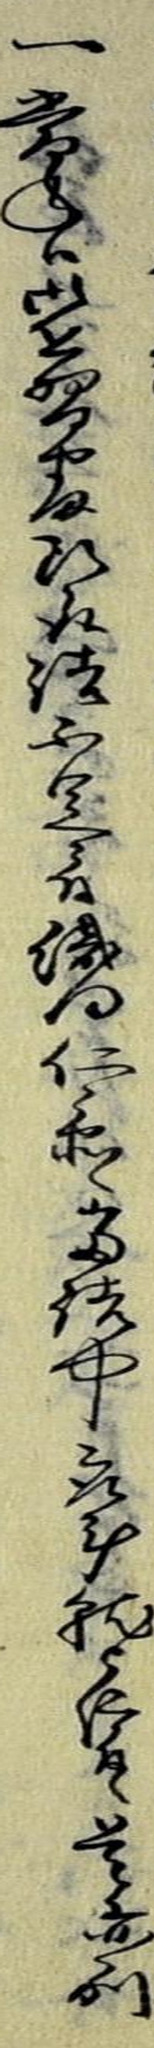一当年は御近習番頭取詰不足に付織田仁兵衛へ当詰中取斗就被仰付候是亦別
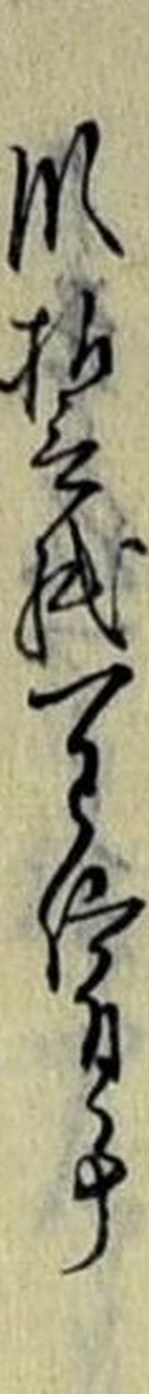段誓紙可被仰付事
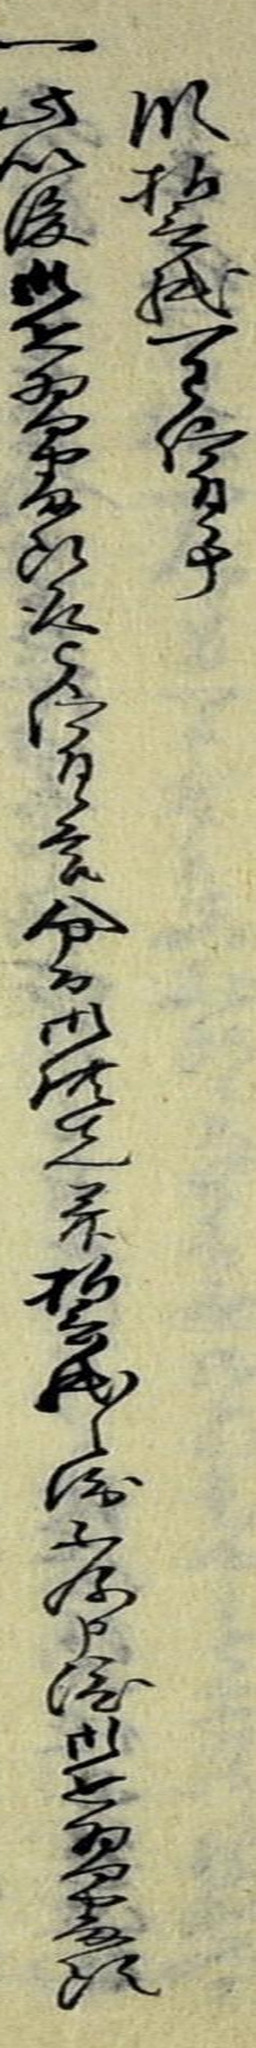一此以後御近習番頭取被仰付候節分而御供先并誓紙之儀不及申渡御近習番頭
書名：命令之部 二
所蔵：福井県文書館 Fukui Prefectural Archives
